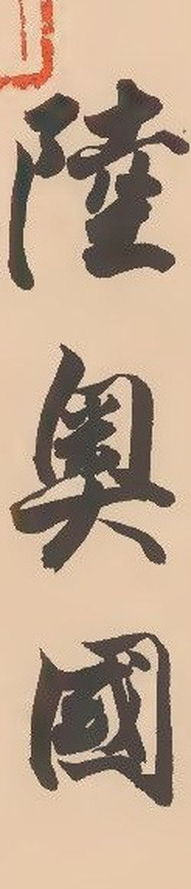陸奥国
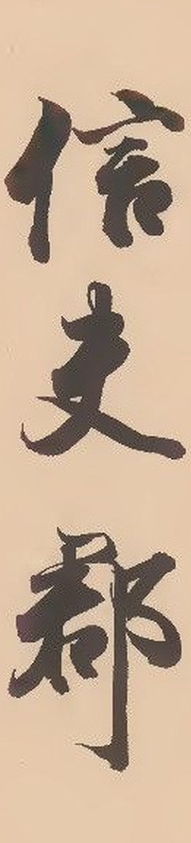信夫郡
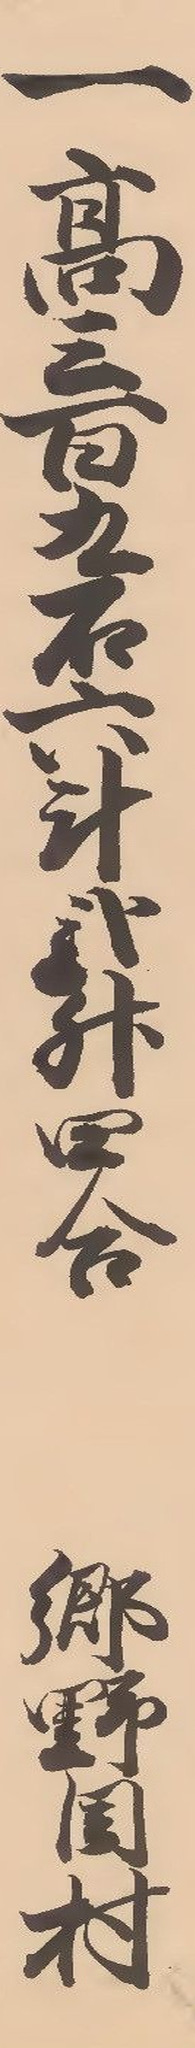一高三百九石六斗弐升四合郷野目村
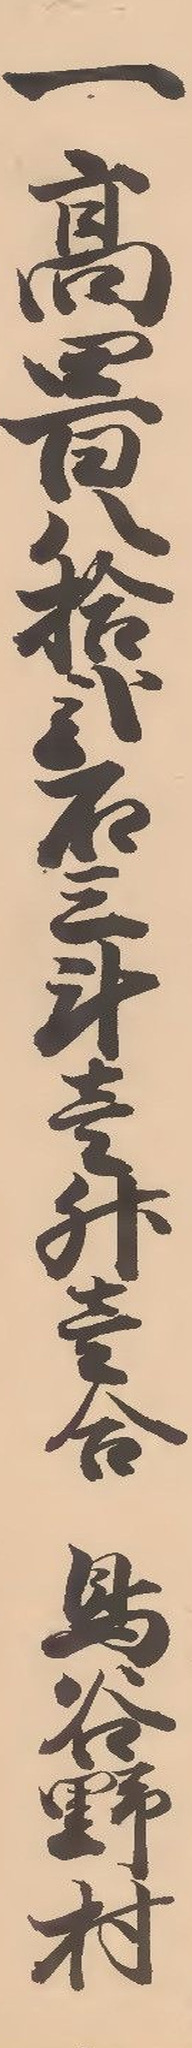一高四百八拾弐石三斗壱升壱合鳥谷野村

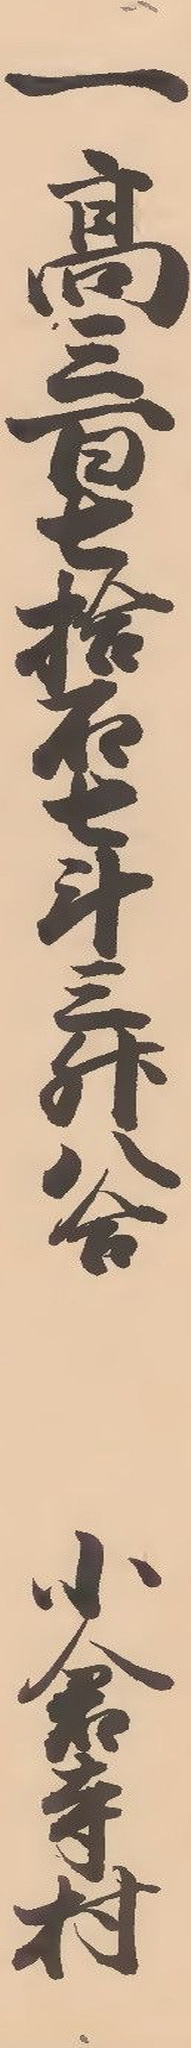一高三百七拾石七斗三升八合小倉寺村
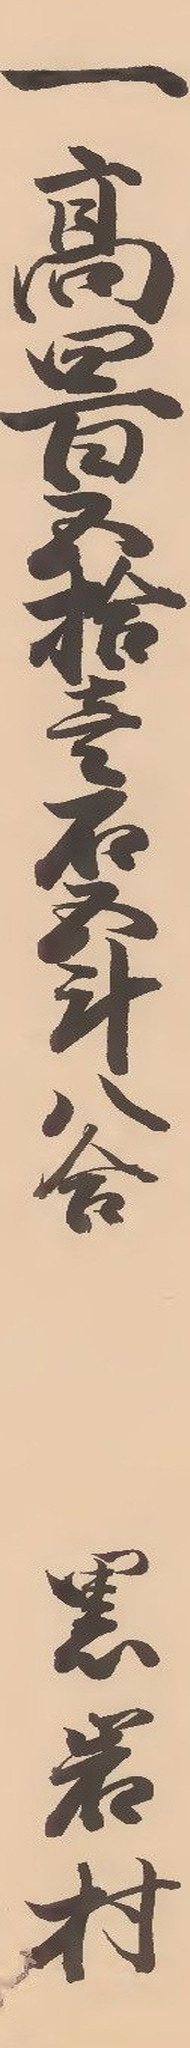一高四百五拾壱石五斗八合黒岩村
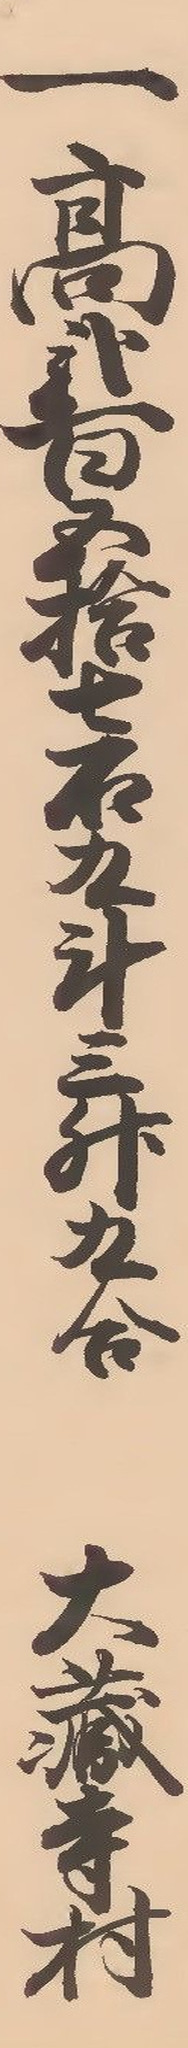一高弐百五拾七石九斗三升九合大蔵寺村
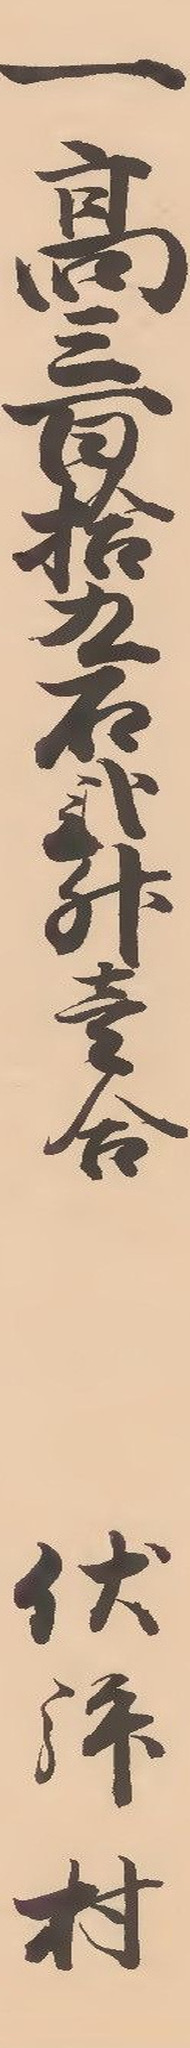一高三百拾九石弐升壱合伏拝村
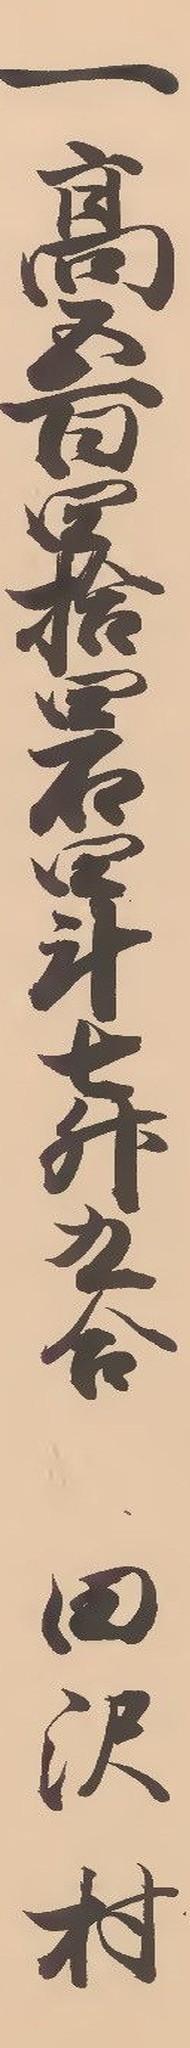一高五百四拾四石四斗七升九合田沢村
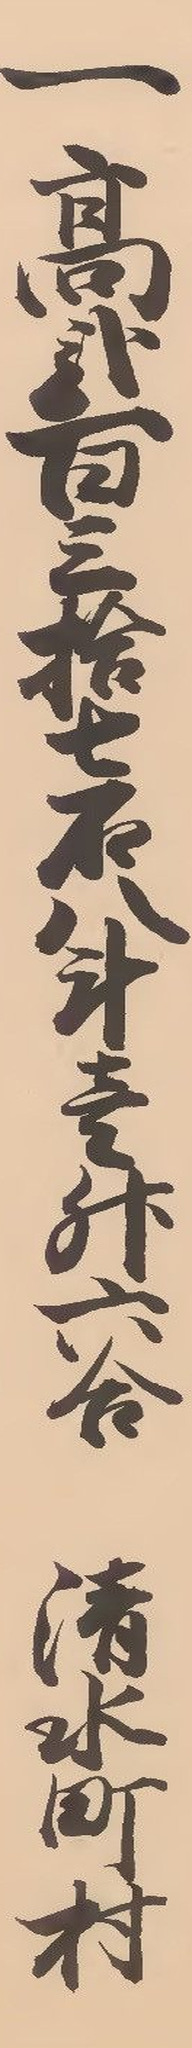一高弐百三拾七石八斗壱升六合清水町村
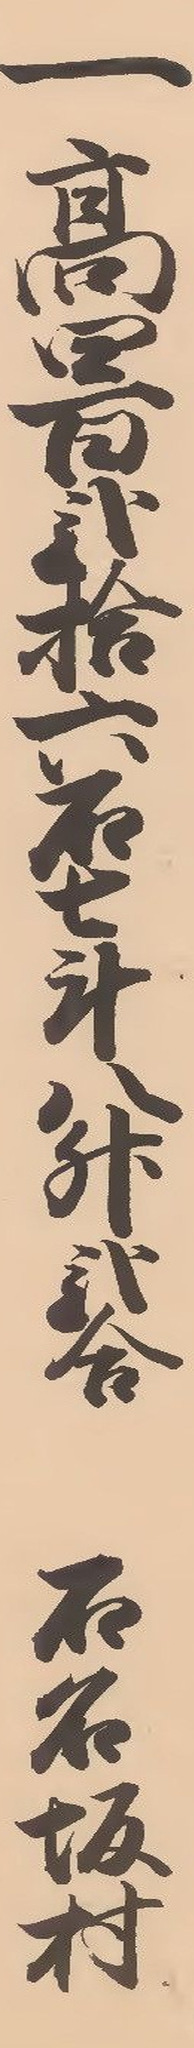一高四百弐拾六石七斗八升弐合石名坂村
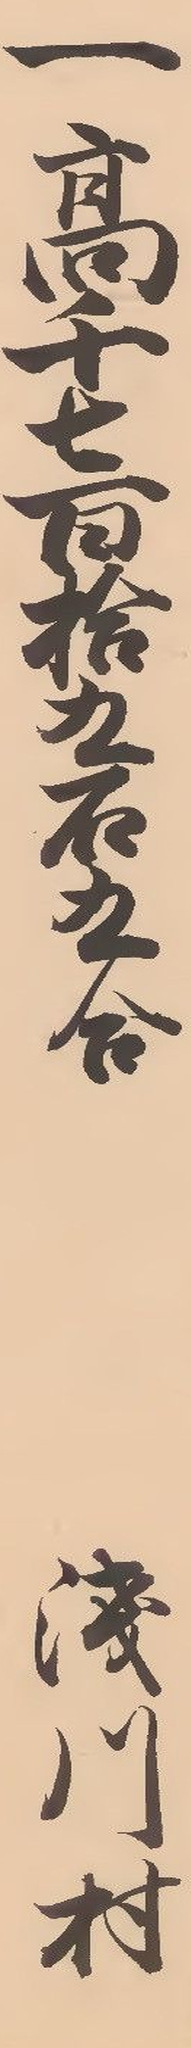一高千七百拾九石九合浅川村

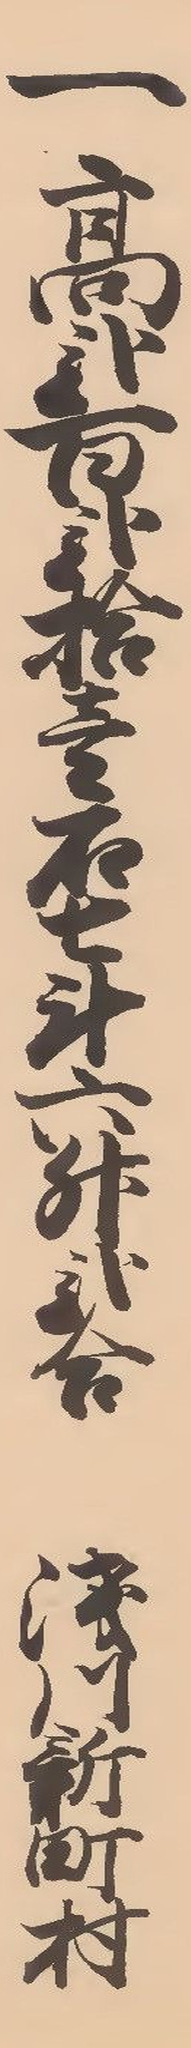一高弐百弐拾壱石七斗六升弐合浅川新町村
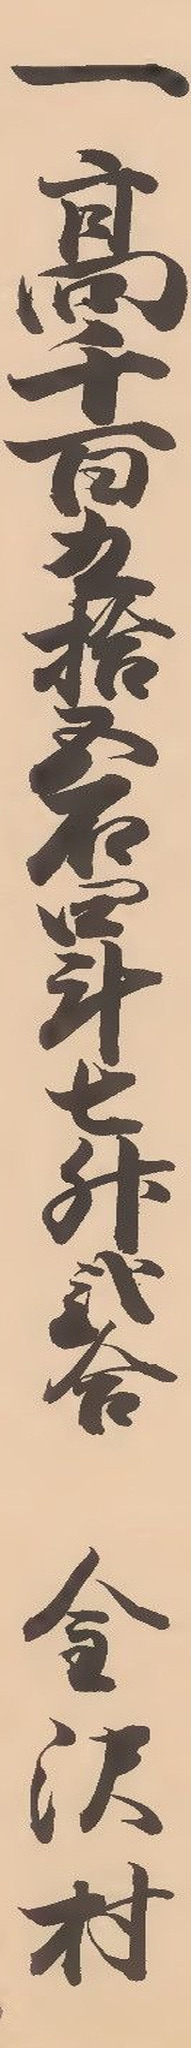一高千百九拾五石四斗七升弐合金沢村
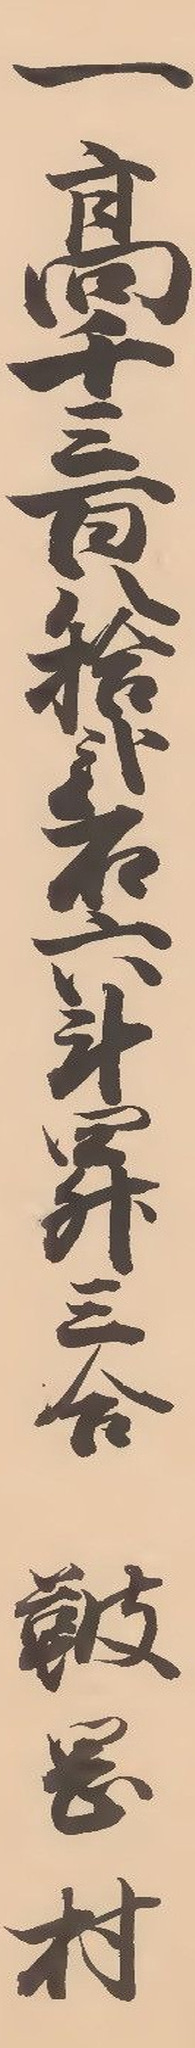一高千三百八拾弐石六斗四升三合鼓岡村
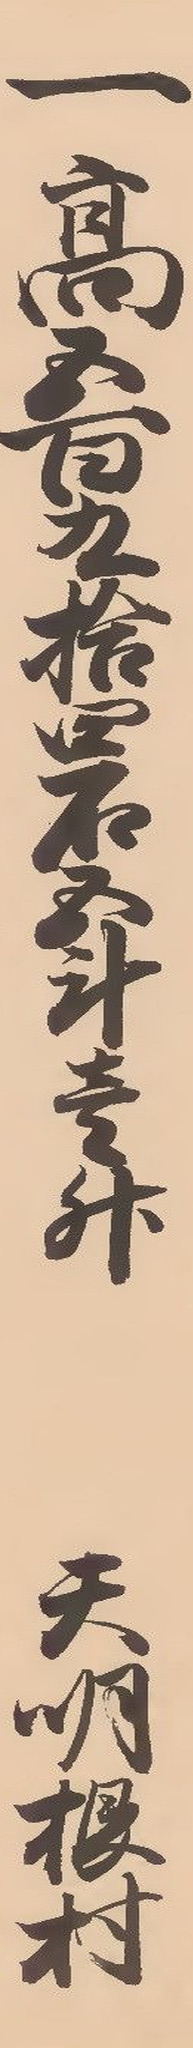一高五百九拾四石五斗壱升天明根村
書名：陸奥国郷帳　４
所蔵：国立公文書館 National Archives of Japan
